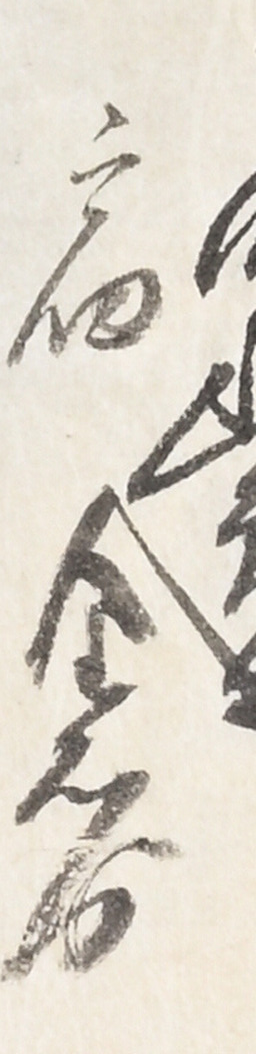宿金右衛門
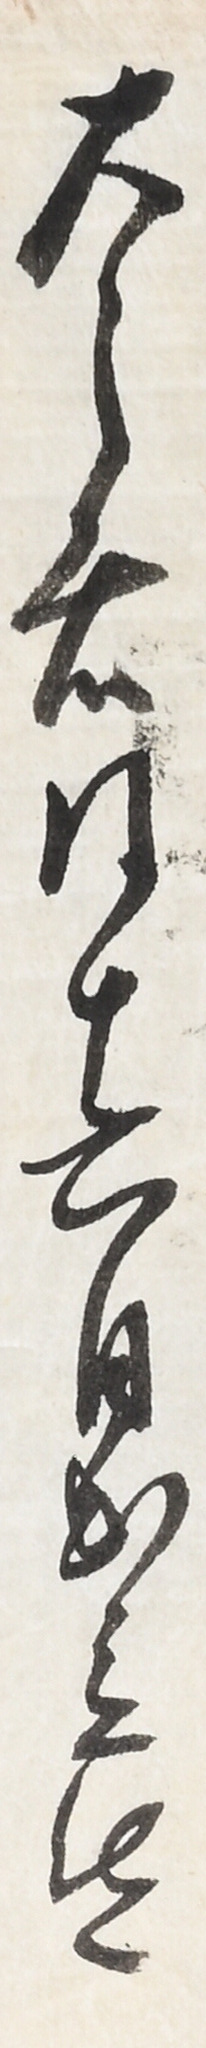右之者同十六日出立仕候
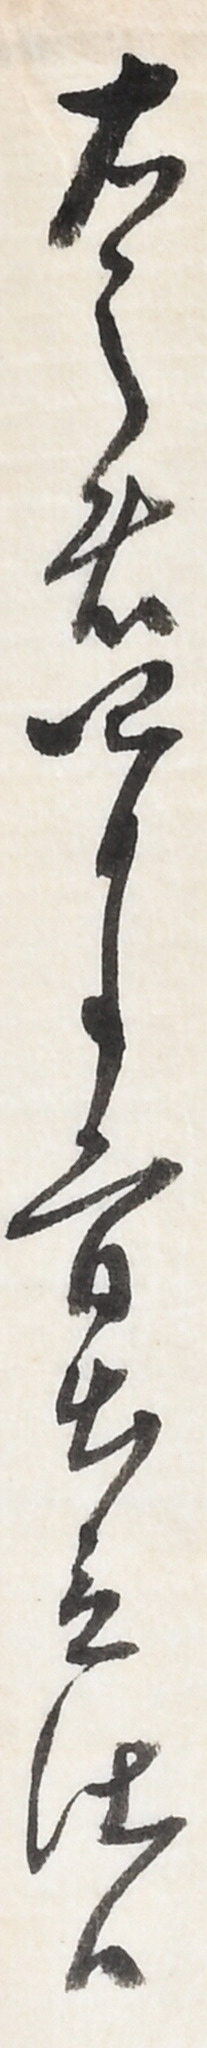右之者四月十二日出立仕候
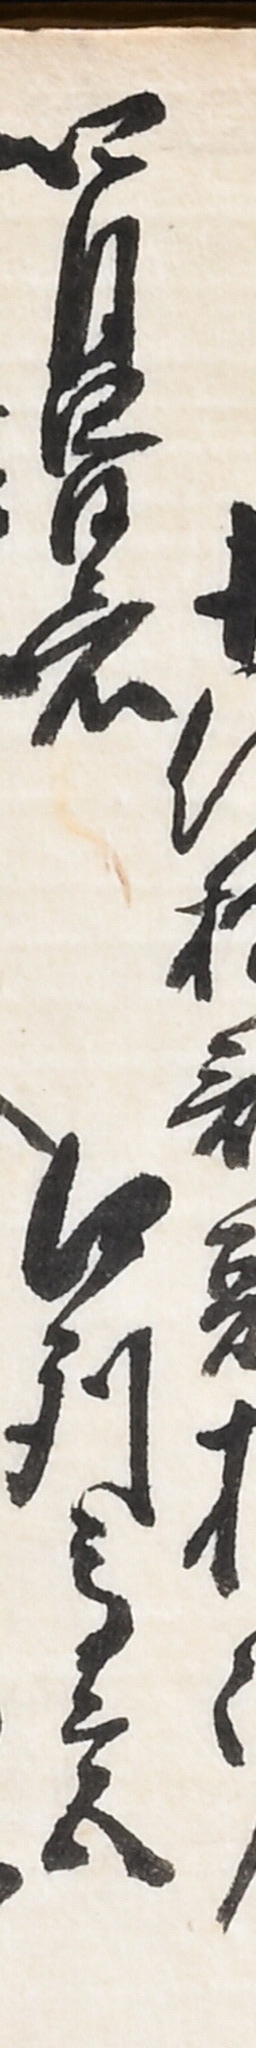四月四日着江州高宮
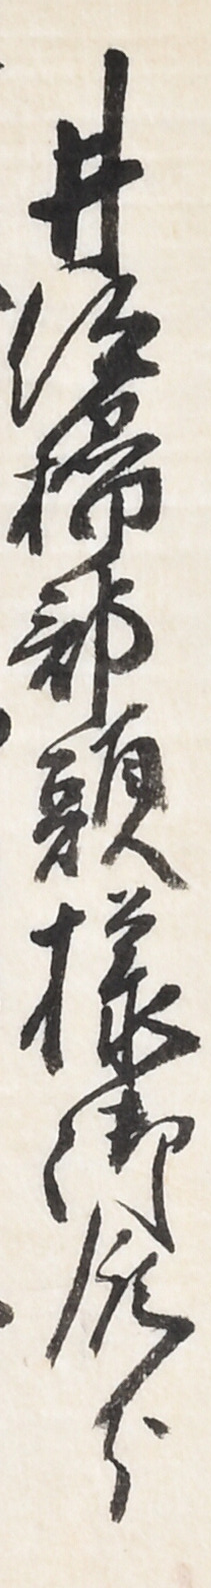井伊掃部頭様御領分
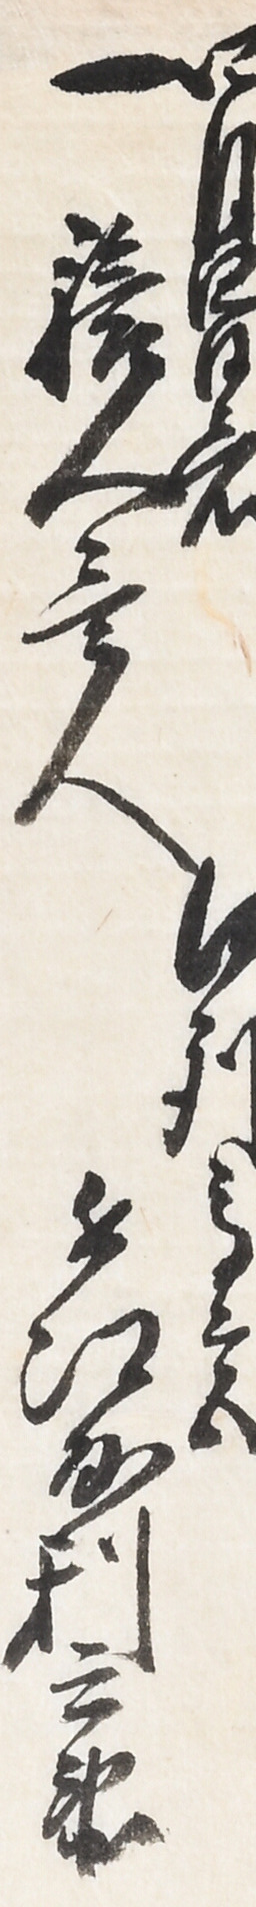一旅人壱人近江屋利兵衛
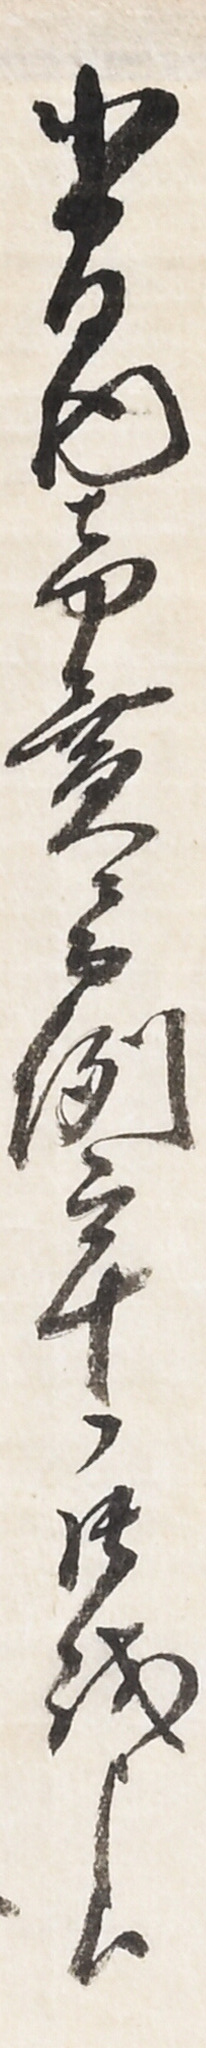小間物商売ニ而例年罷越申候
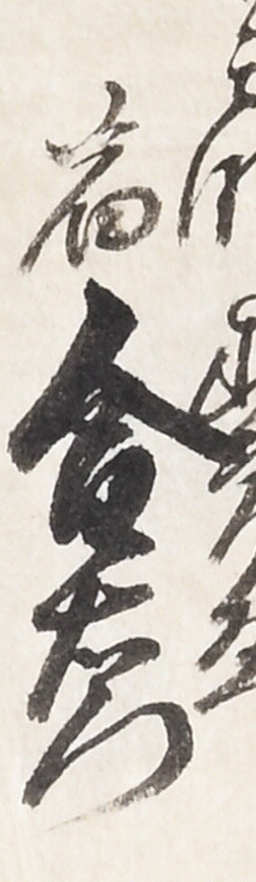宿金右衛門
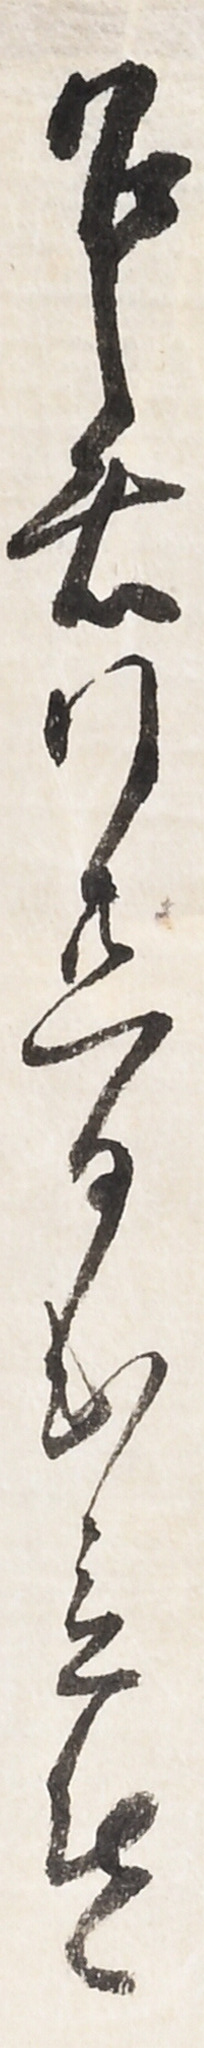右之者同廿一日出立仕候
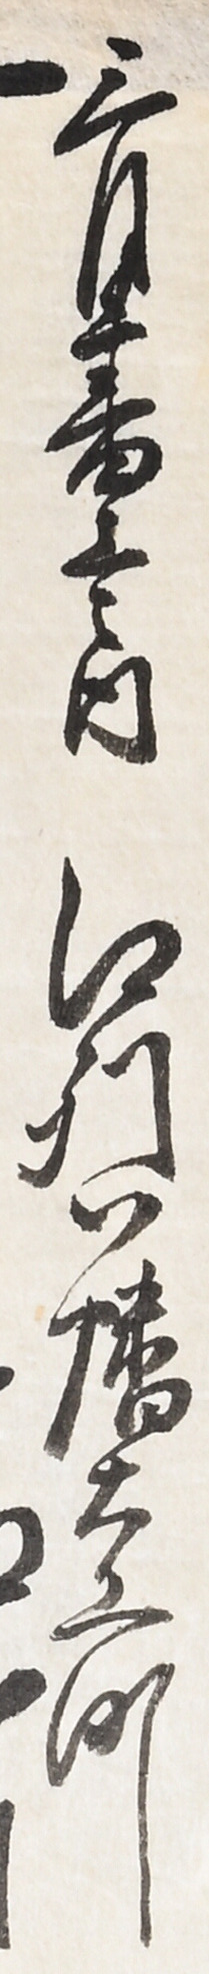三月書上之内江州八幡大工町
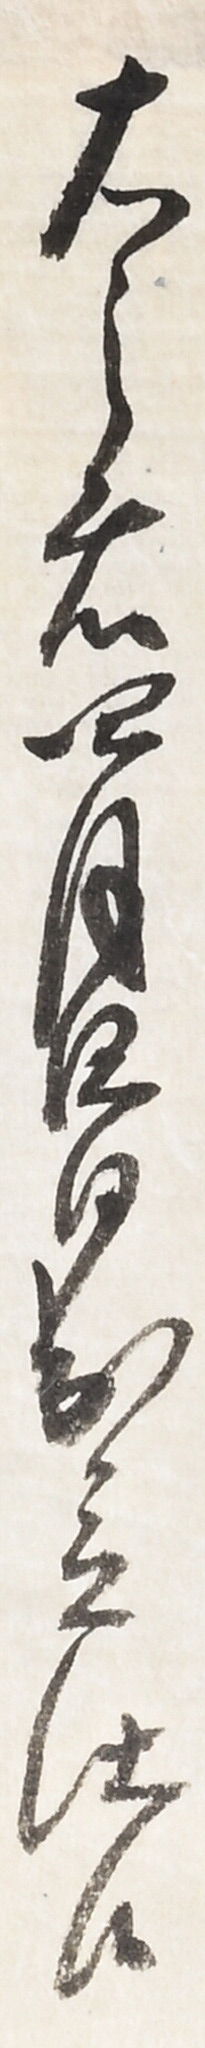右之者四月四日出立仕候
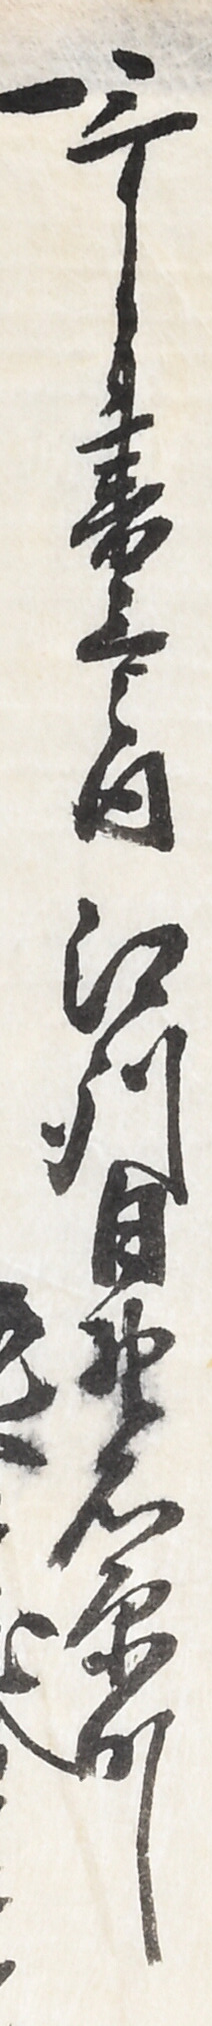三月書上之内江州日野石原町
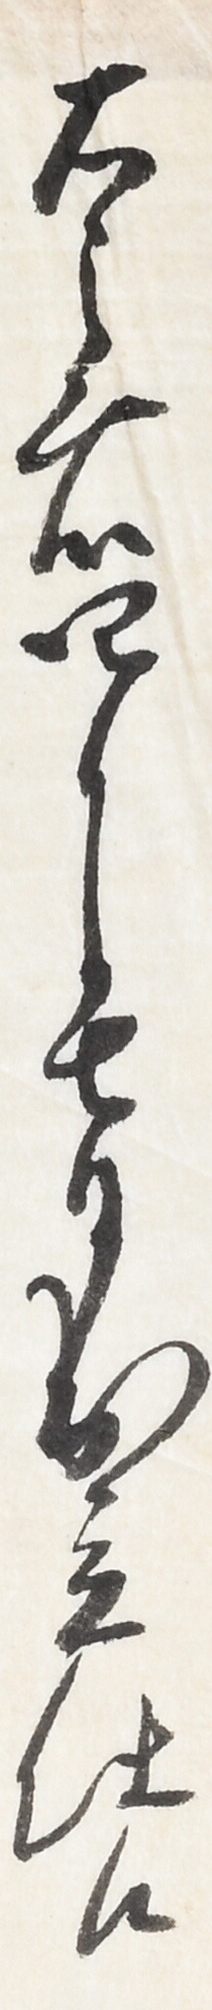右之者四月七日出立仕候
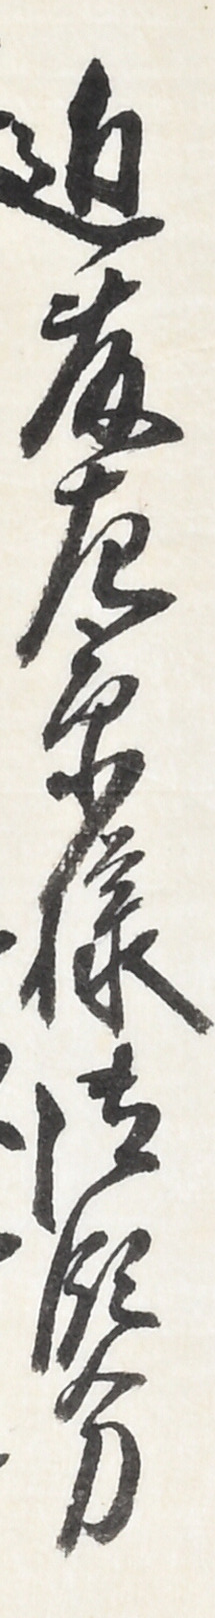近藤左京様御領分
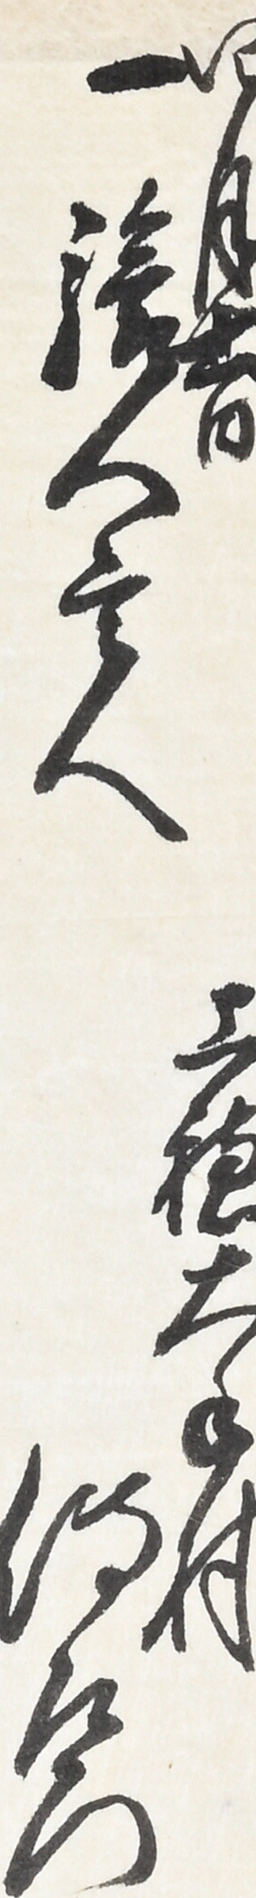一旅人壱人伝左衛門
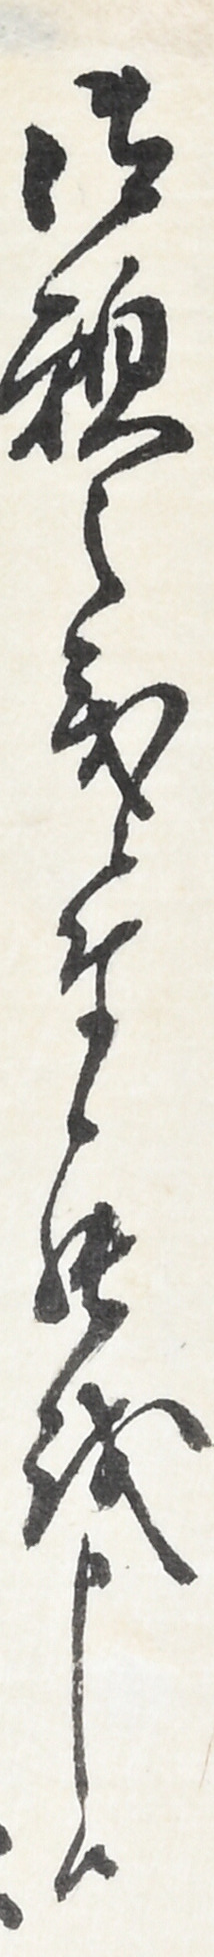御願之義ニ付罷越申候
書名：旅人泊控帳
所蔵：伊那市立高遠町図書館・合同会社AMANE
